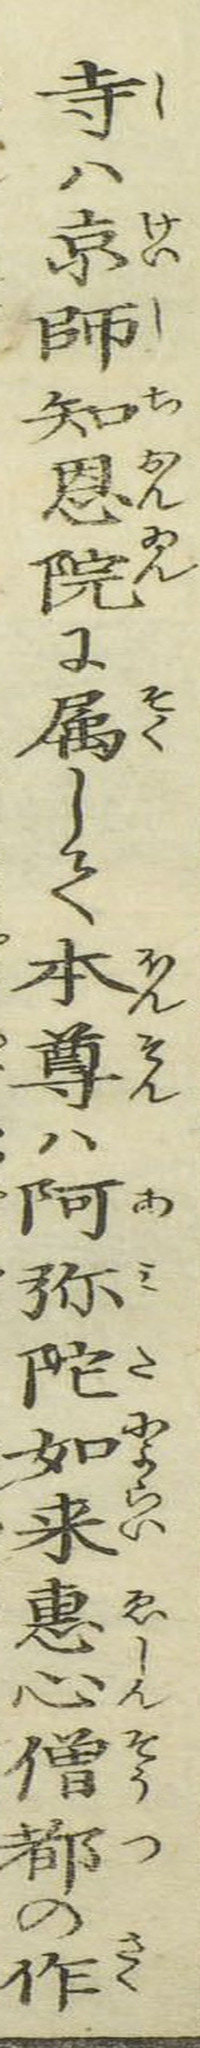寺は京師知恩院に属して本尊は阿弥陀如来惠心僧都の作
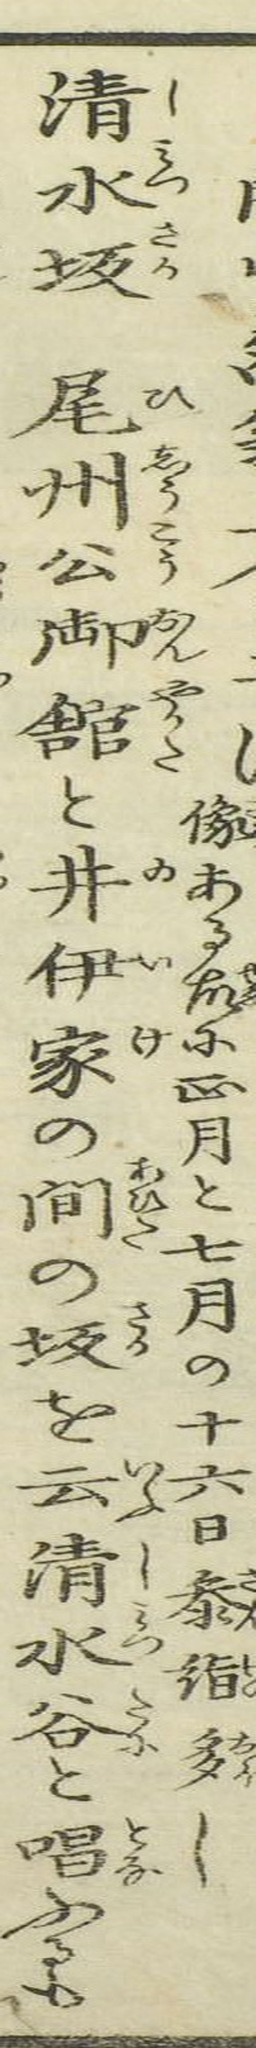清水坂尾州公御舘と井伊家の間の坂を云清水谷と唱ふるも
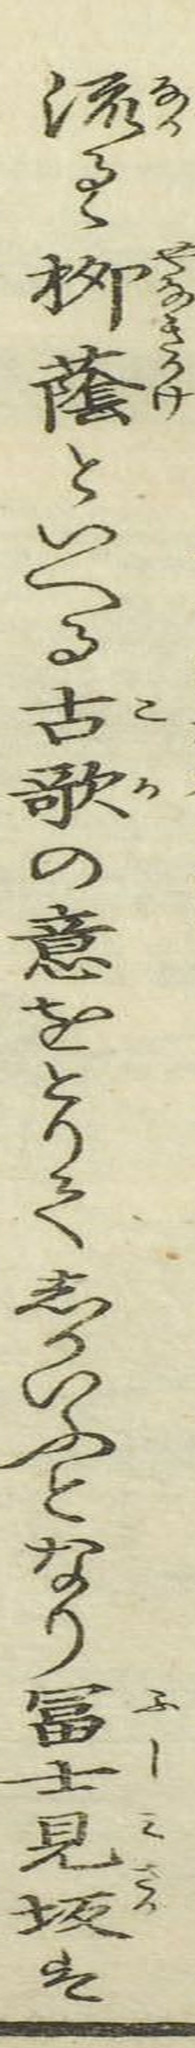流るゝ柳蔭といへる古歌の意をとりてしかいふとなり冨士見坂は
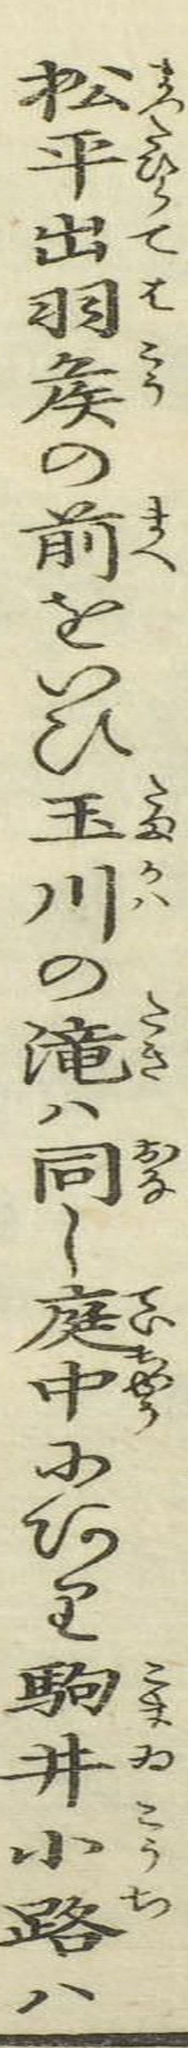松平出羽矦の前をいひ玉川の滝は同し庭中にあり駒井小路は
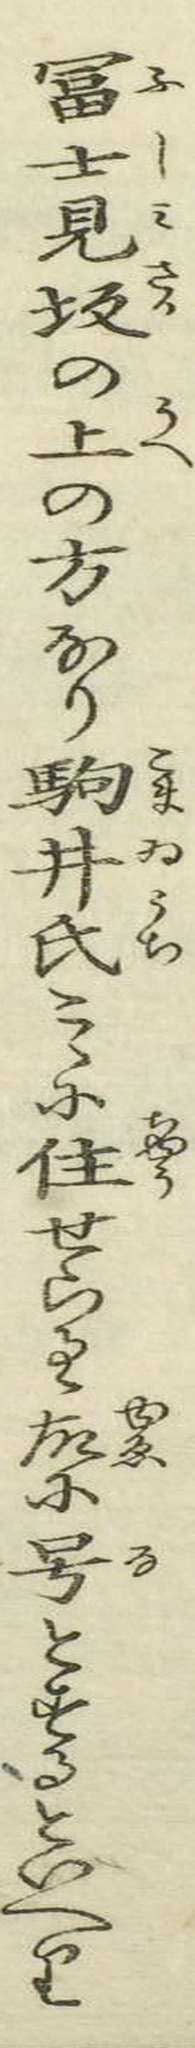冨士見坂の上の方なり駒井氏こゝに住せらるゝ故に号とするといへり
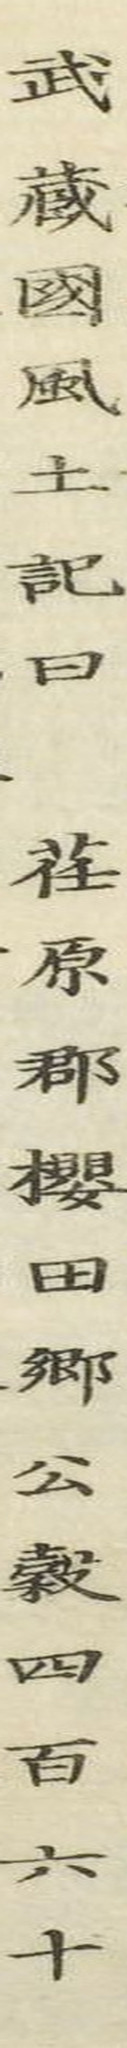武蔵國風土記曰荏原郡櫻田郷公穀四百六十
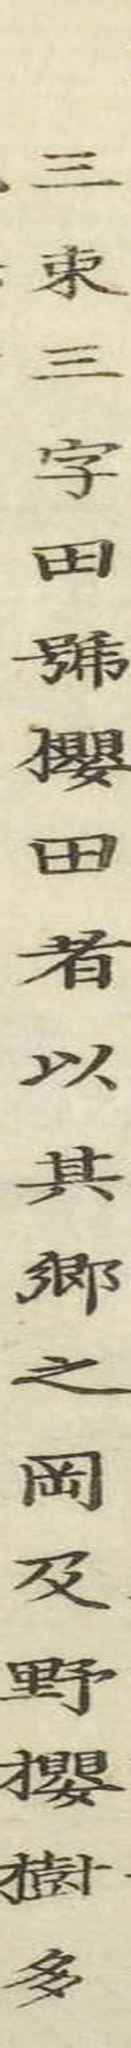三束三字田號櫻田者以其郷之岡及野櫻樹多
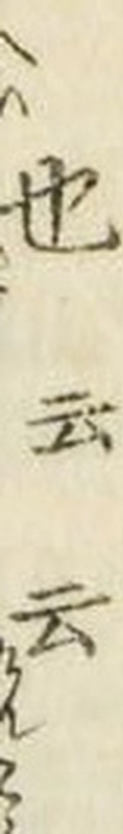也云云

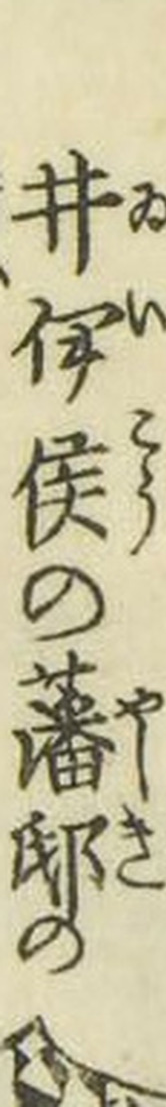井伊侯の藩邸の
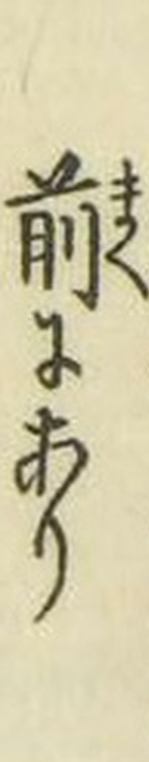前にあり
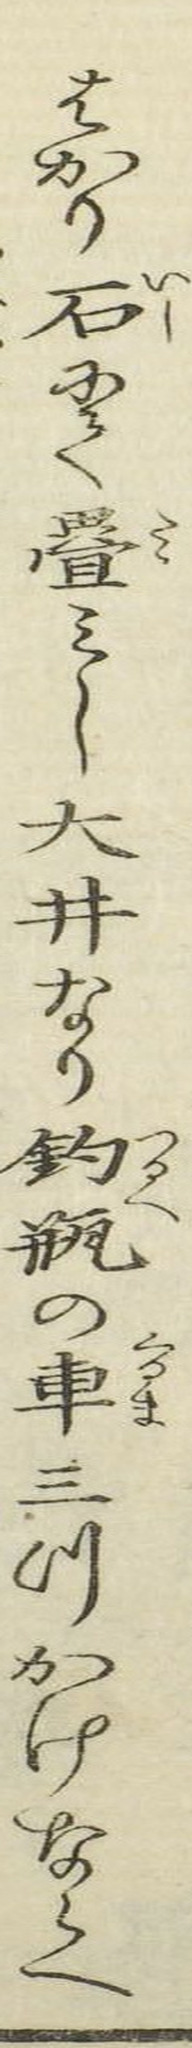はかり石にて畳みし大井なり釣瓶の車三つかけならへ
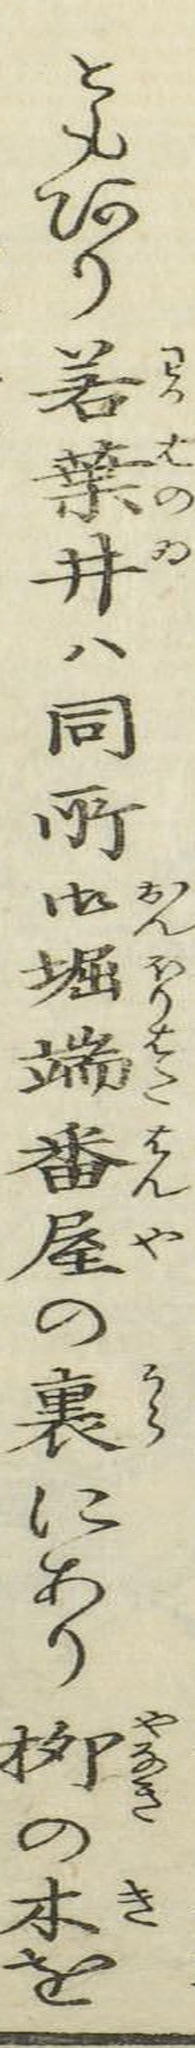ともあり若葉井は同所御堀端番屋の裏にあり栁の木を

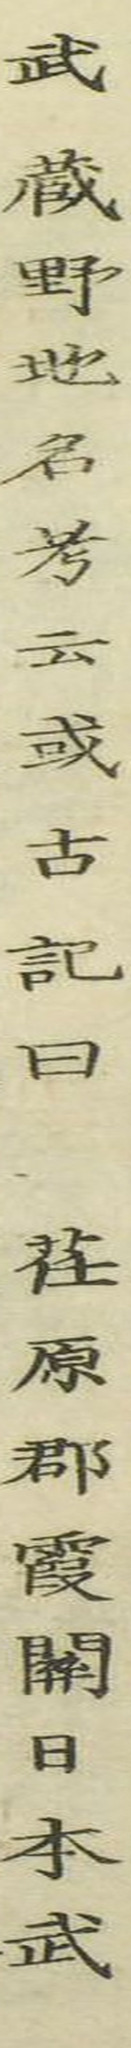武蔵野地名考云或古記曰荏原郡霞關日本武
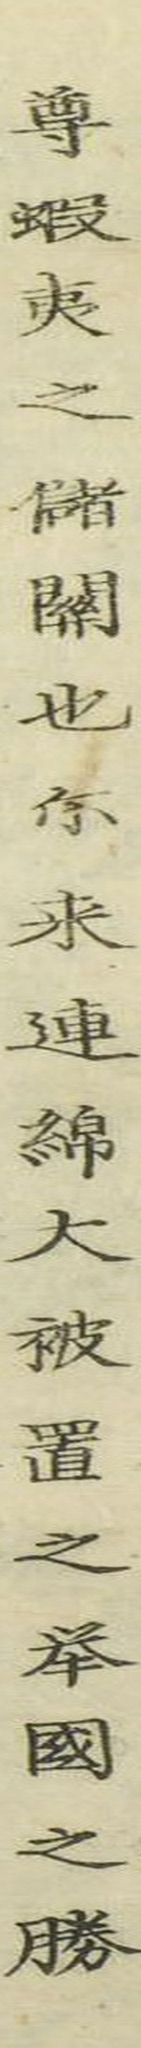尊蝦夷之儲關也尓来連綿大被置之挙國之勝
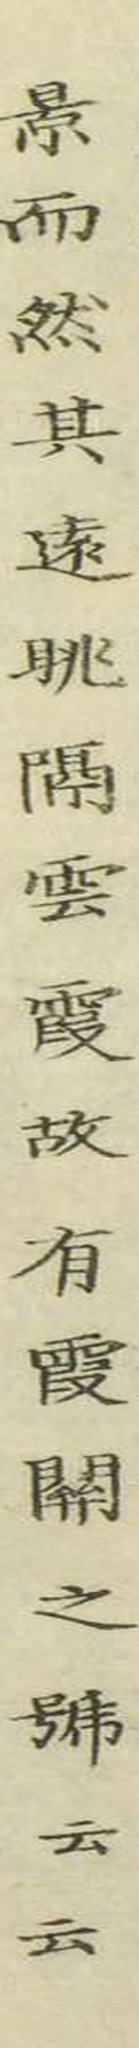景而然其遠眺隔雲霞故有霞關之號云云
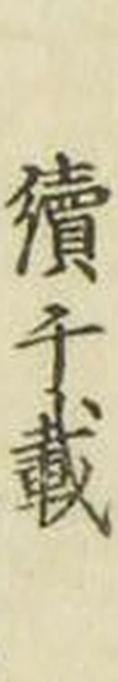續千載
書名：江戸名所図会 20巻 巻之7
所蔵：東京学芸大学教育コンテンツアーカイブ
